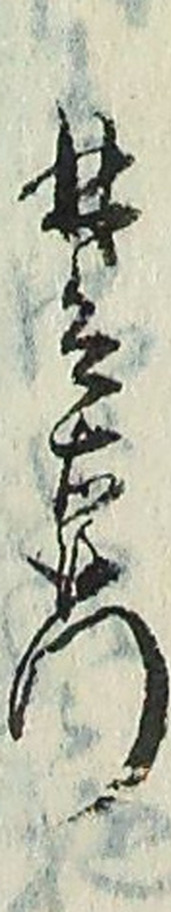林兵右衛門
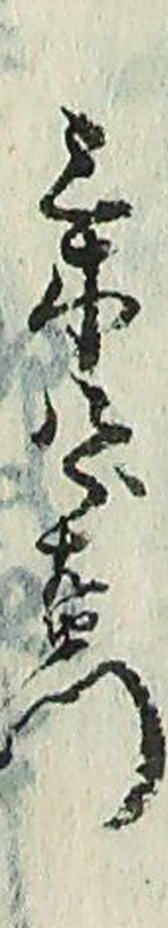三木八郎右衛門
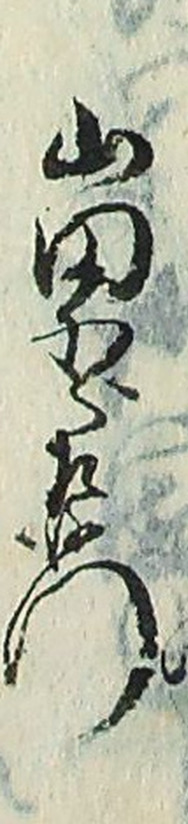山田五郎左衛門
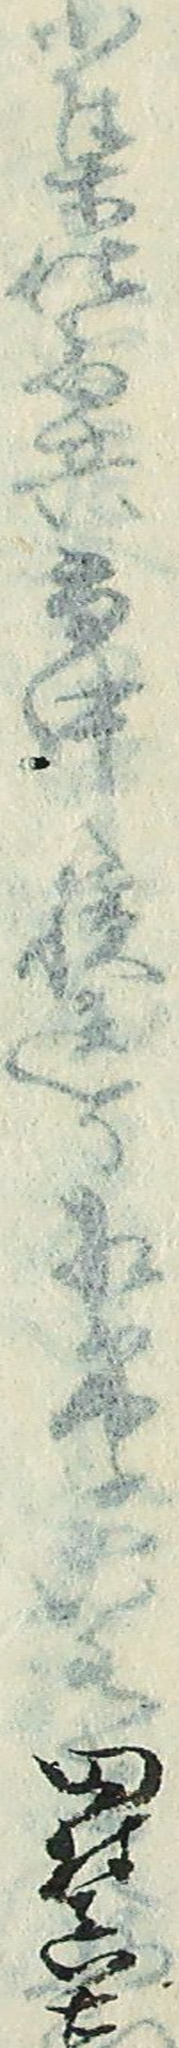田村真右衛門
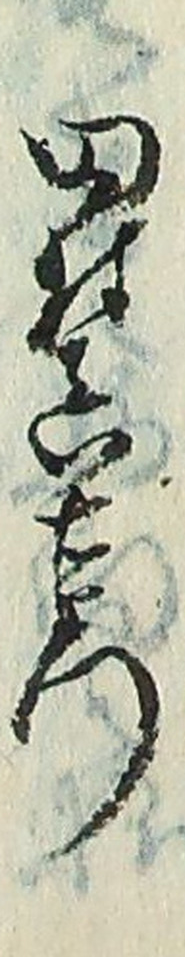田村真右衛門

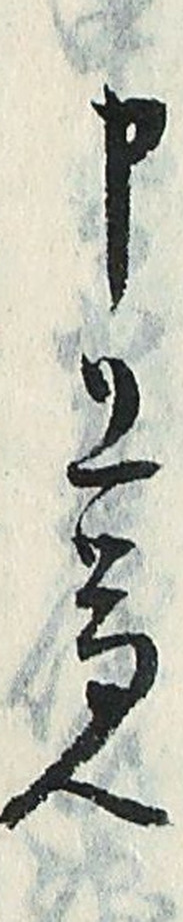申上覚
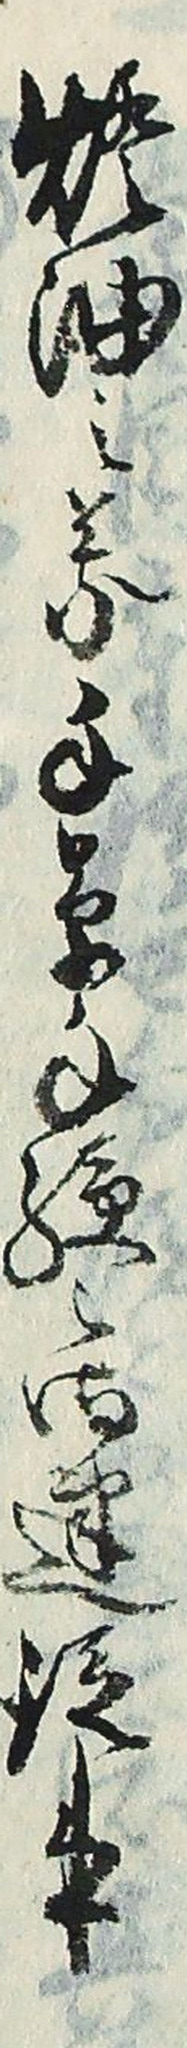燈油之義手草手絞之御速従事
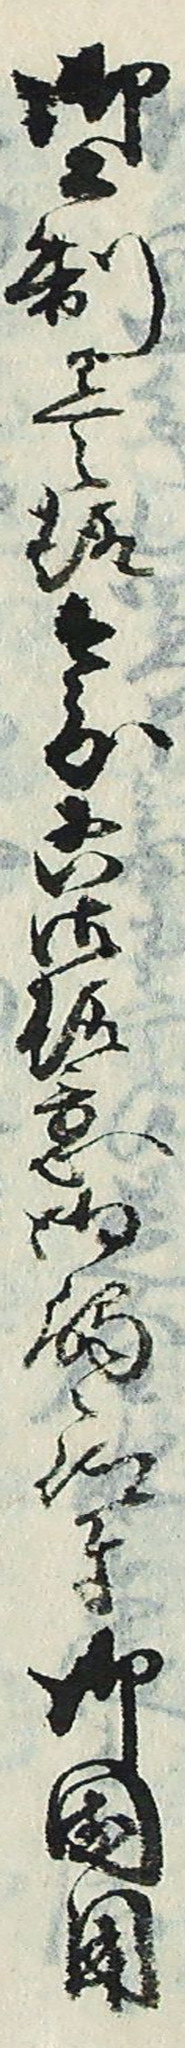御公制有之趣今度右御趣意御触被仰付御国用
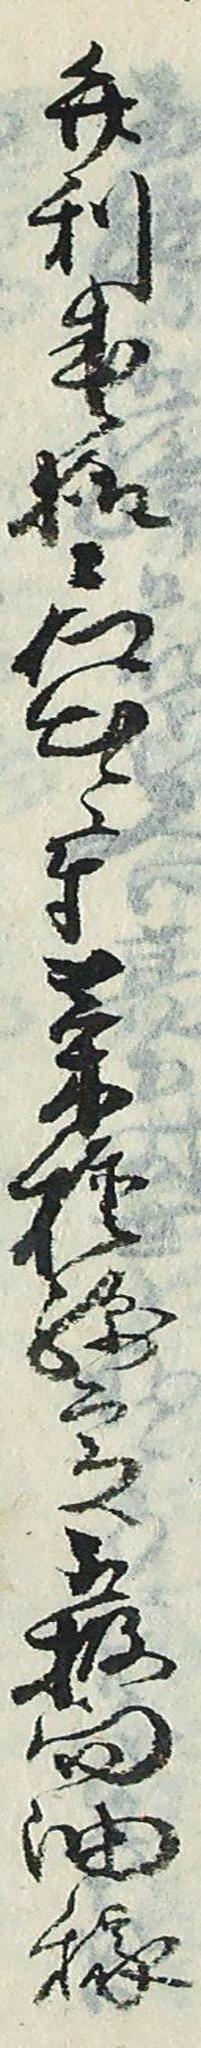弁利成候様被仰出候に付菜種綿実取扱向油稼
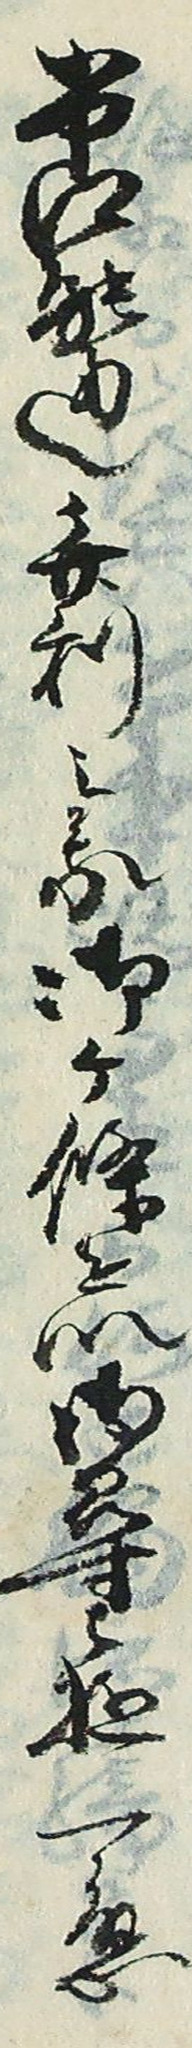市郷融通弁利之義御ケ條を以御尋被遊一応
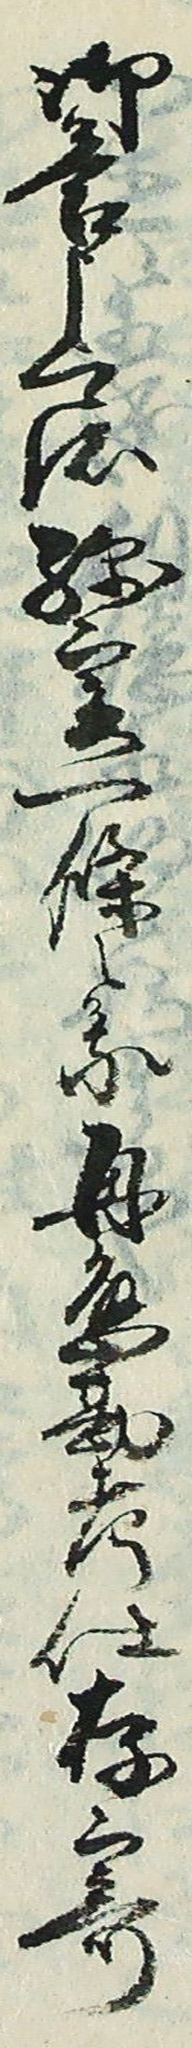御答申上候所綿実一條之義再応勘考仕存寄
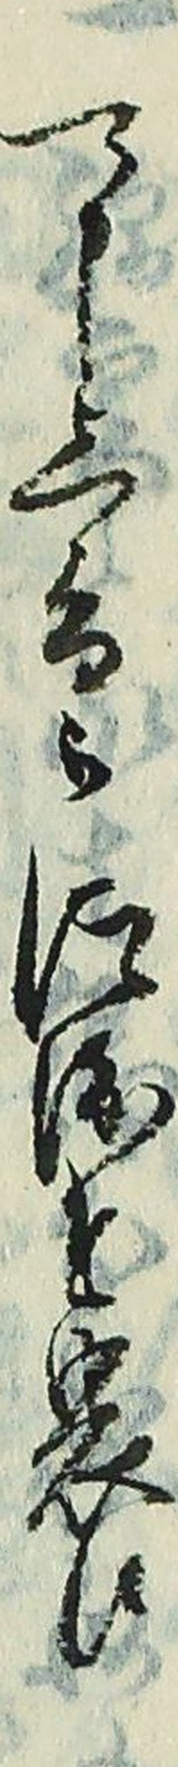可申上旨被仰渡奉畏候
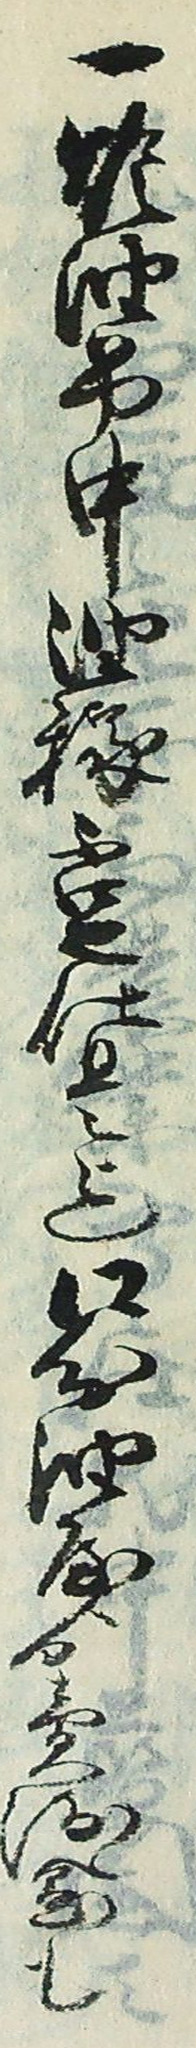一燈油市中油稼不足仕是迄郷分油屋ゟ売渡懸も
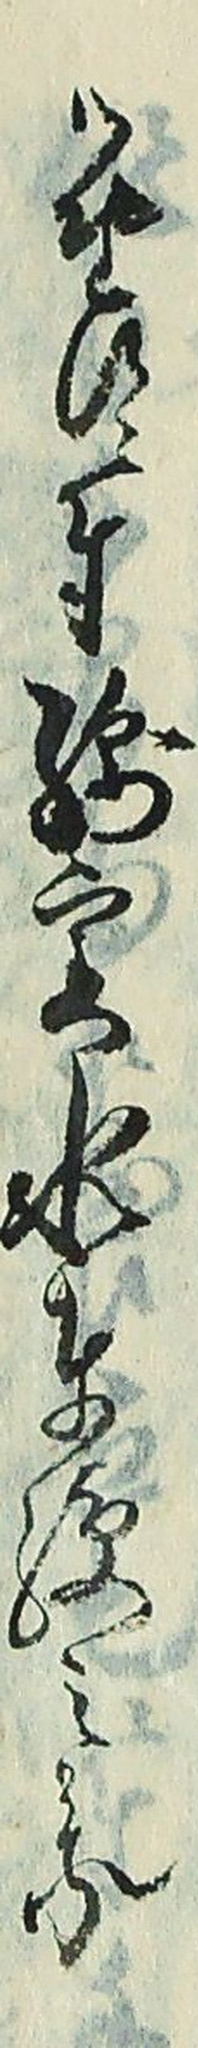御坐候に付綿実水車絞之義
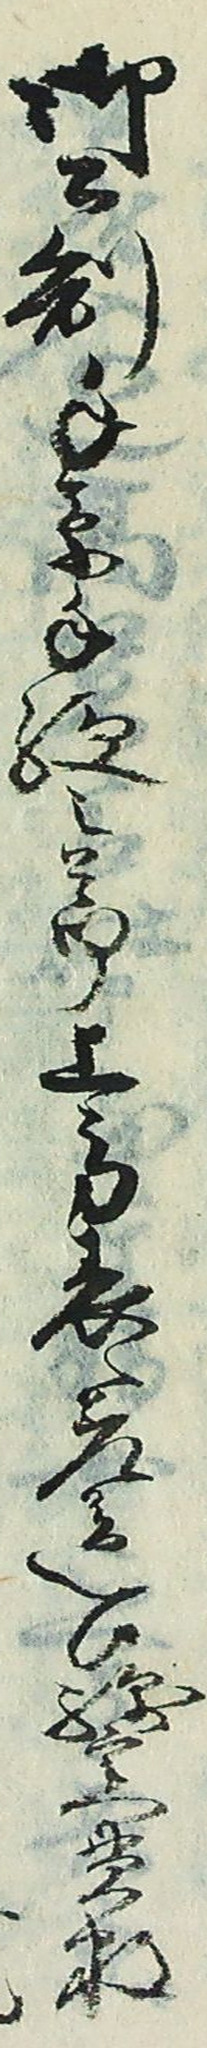御公制手草手絞之節上方表へ差送り候綿実貫数
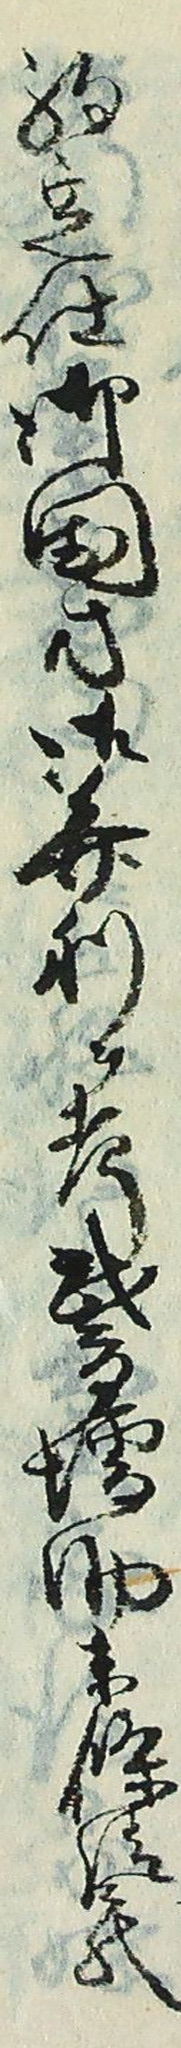約束仕御国方御弁利を考武市増助末條清蔵
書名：油稼御取究ニ附御箇條書テ以被仰渡南北同役申談御答書控
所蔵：鳴門教育大学 Naruto University of Education
